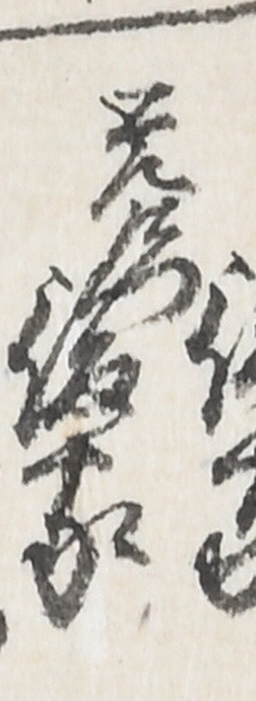七左衛門
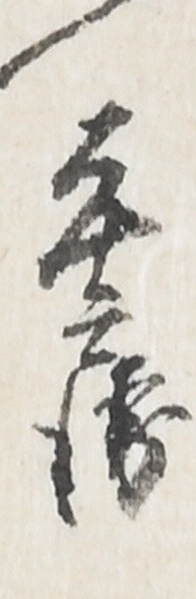平兵衛
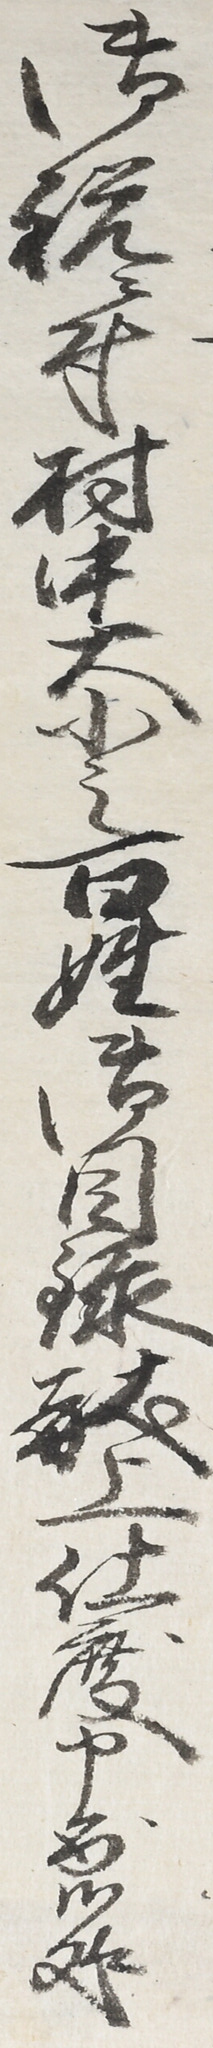御祝ニ付村中大小之百姓御目録献上仕度申通候処
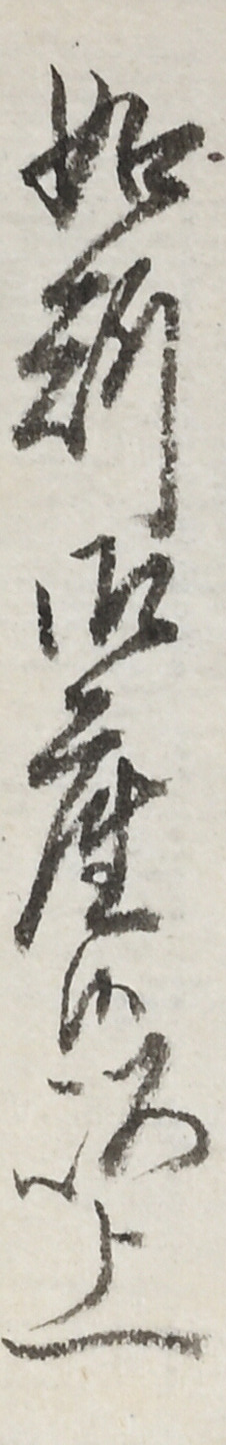如斯御座候以上
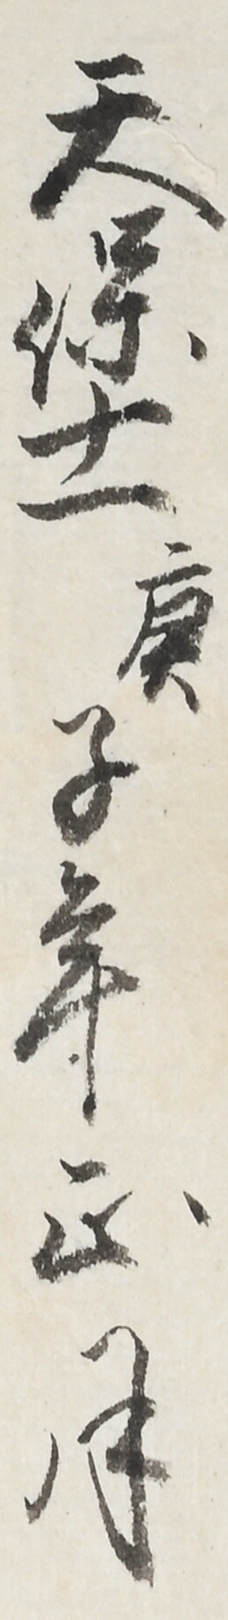天保十一庚子年正月

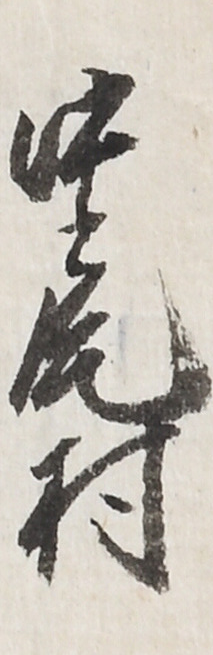中尾村
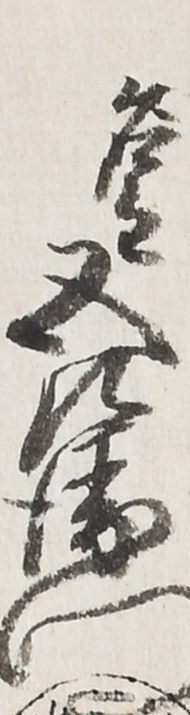名主五左衛門㊞
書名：御拝地百五拾年御祝儀献上御目録名前
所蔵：伊那市立高遠町図書館・合同会社AMANE
